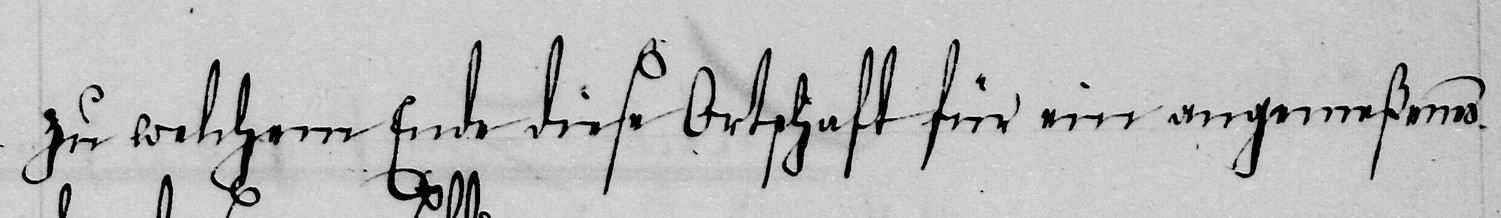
zu welchem Ende diese Ortschaft für ein angemeßenes
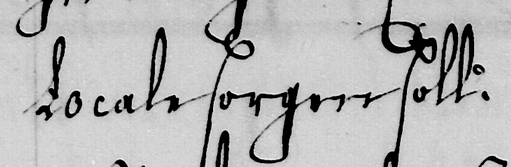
Locale sorgen soll.
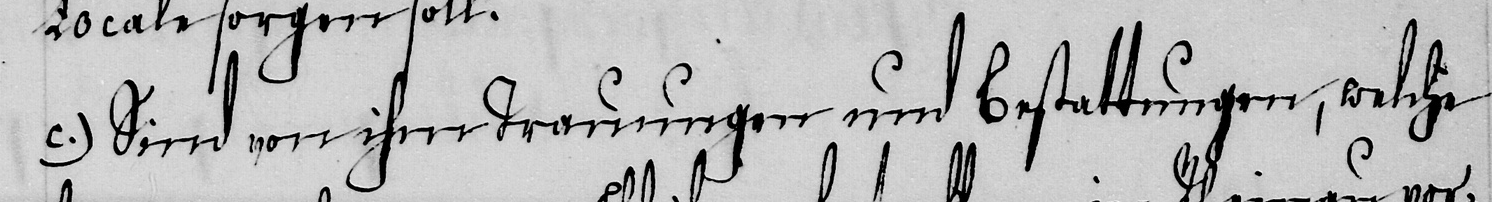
c.) Sind von ihm Trauungen und Bestattungen, welche
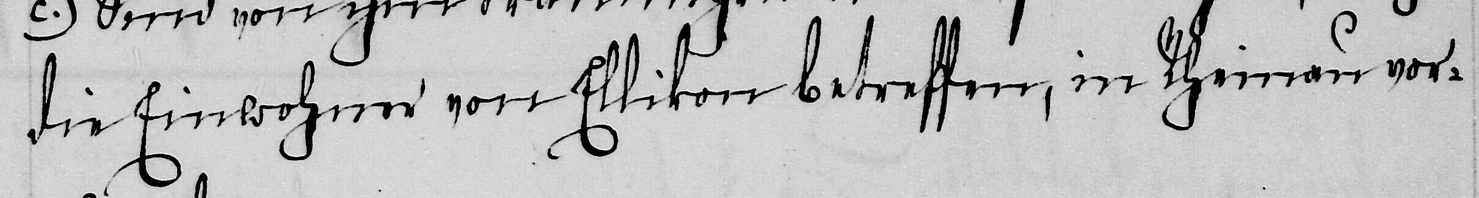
die Einwohner von Ellikon betreffen, in Rheinau vor¬
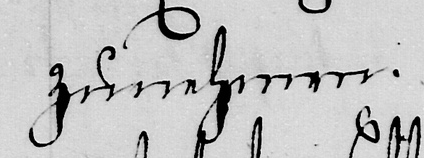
zunehmen.
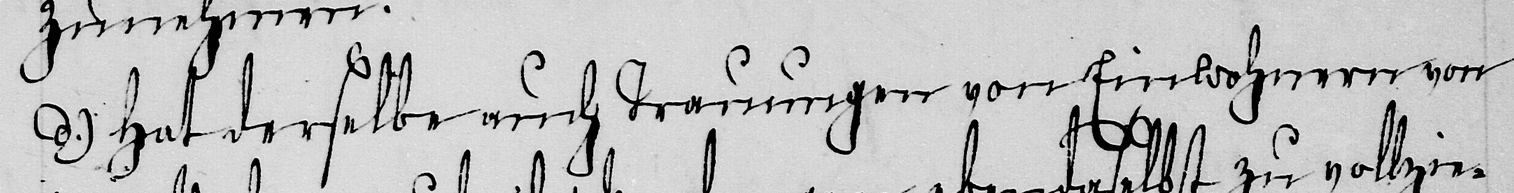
d.) Hat derselbe auch Trauungen von Einwohnern von
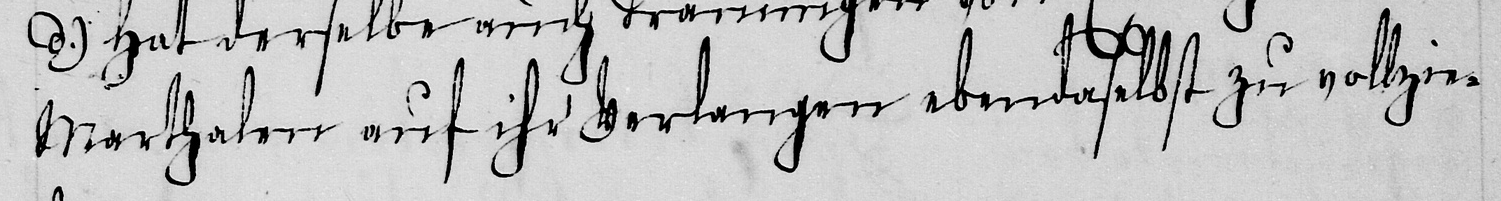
Marthalen auf ihr Verlangen ebendaselbst zu vollzie¬
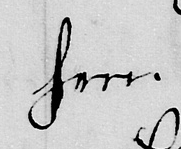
hen.
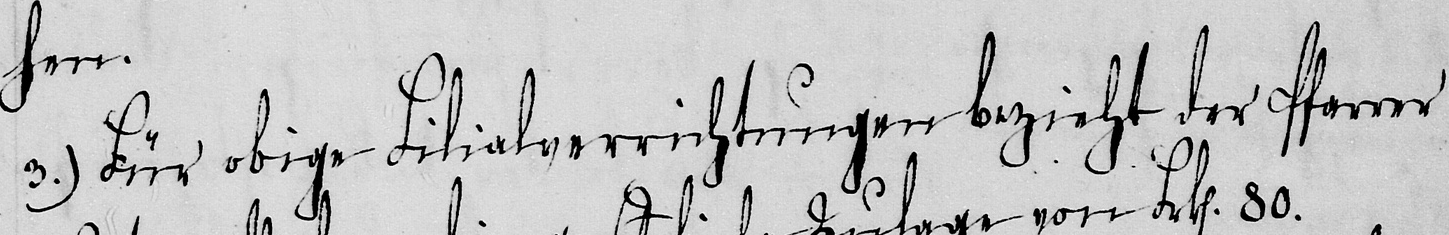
3.) Für obige Filialverrichtungen bezieht der Pfarr¬
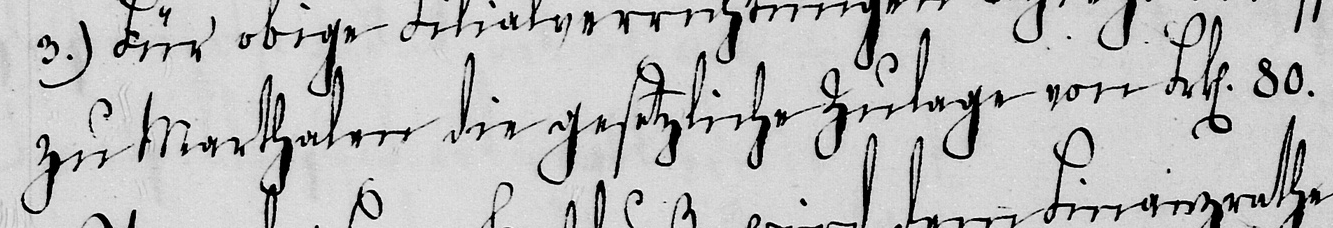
zu Marthalen die gesetzliche Zulage von Frk[en]. 80.
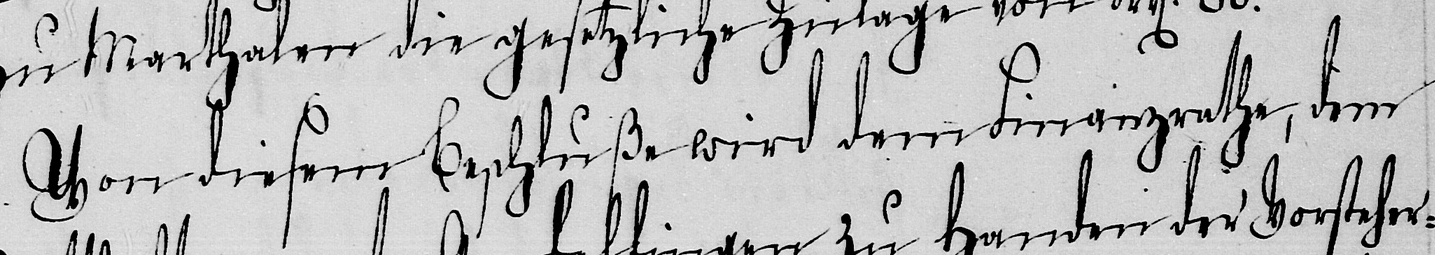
Von diesem Beschluße wird dem Finanzrathe, dem
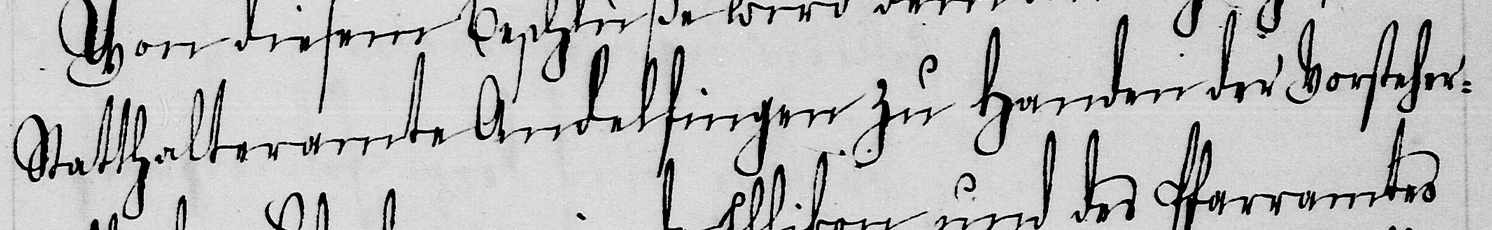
Statthalteramte Andelfingen zu Handen der Vorsteher¬
